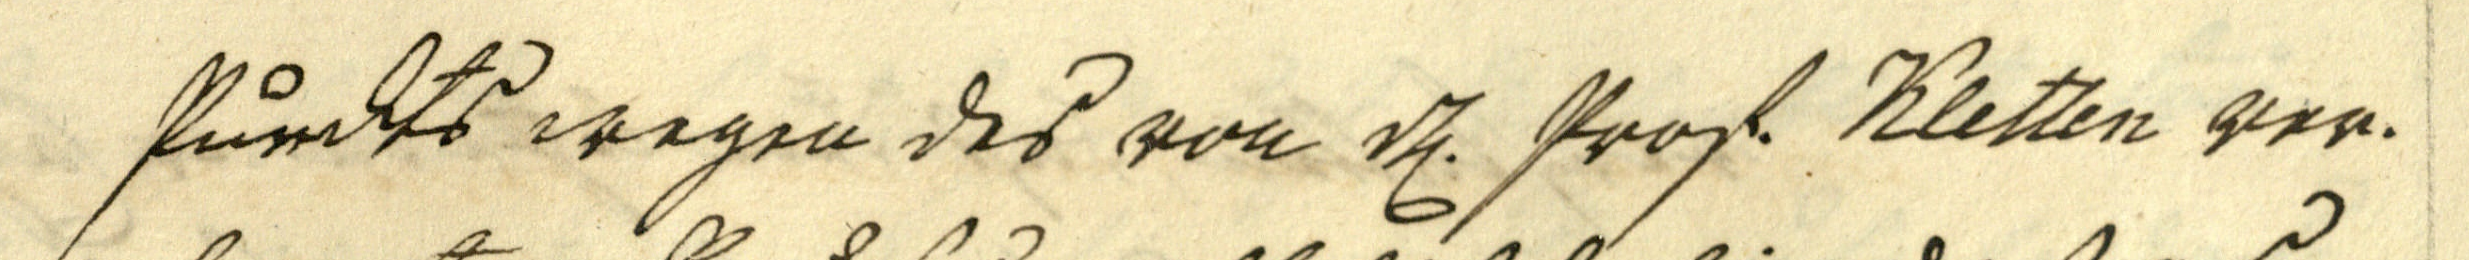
Punckts wegen des von dh. Prof. Kletten ver¬
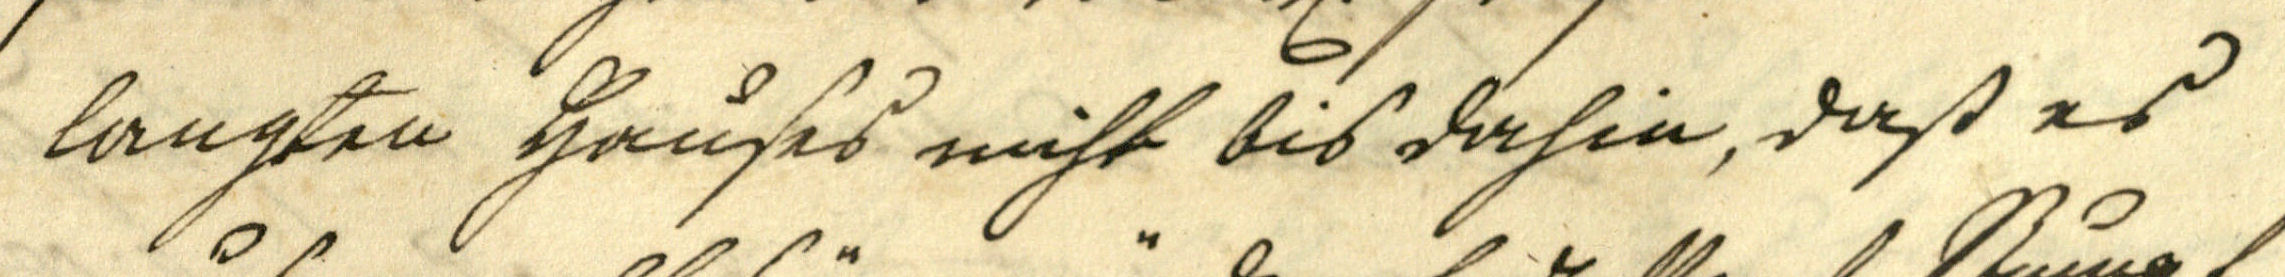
langten Hauses nicht bis dahin, daß es
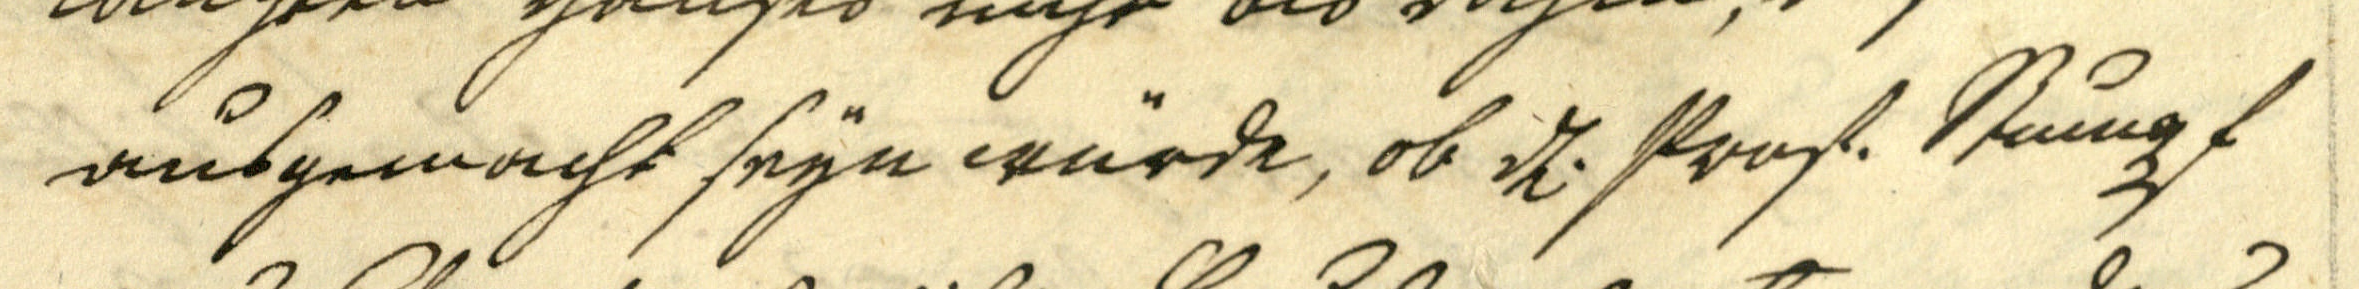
ausgemacht seÿn würde, ob dh. Prof. Stumpf
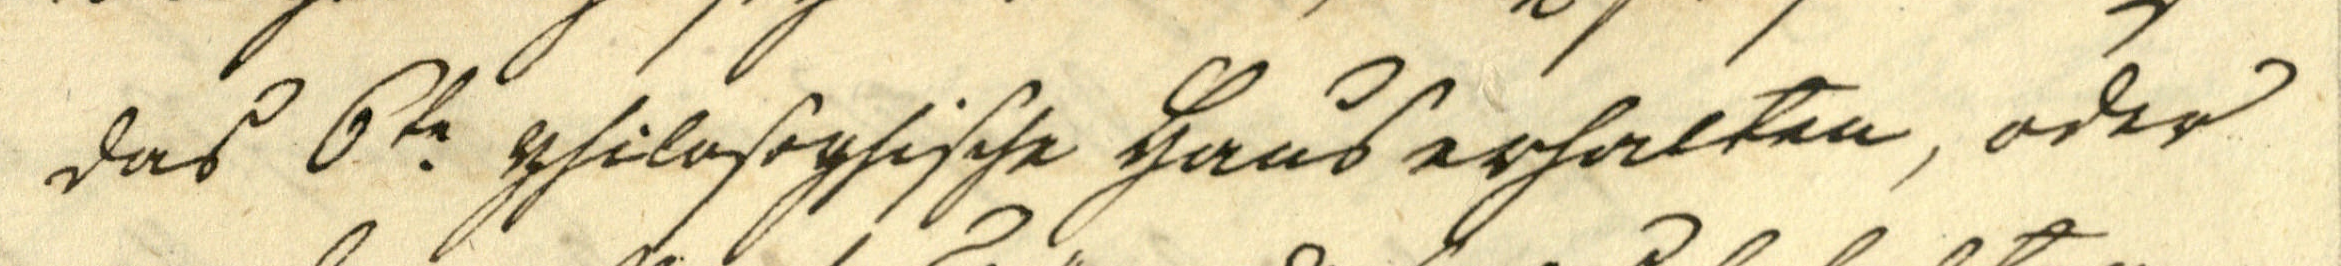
das 6 te philosophischen Haus erhalten, oder
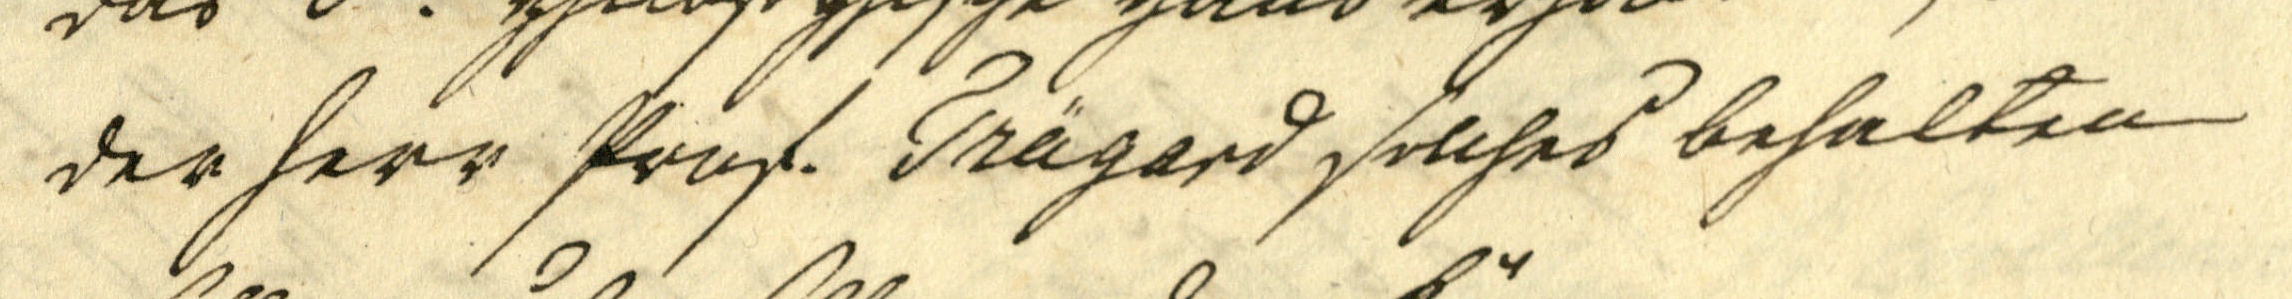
der Herr Prof. Trägård solches behalten
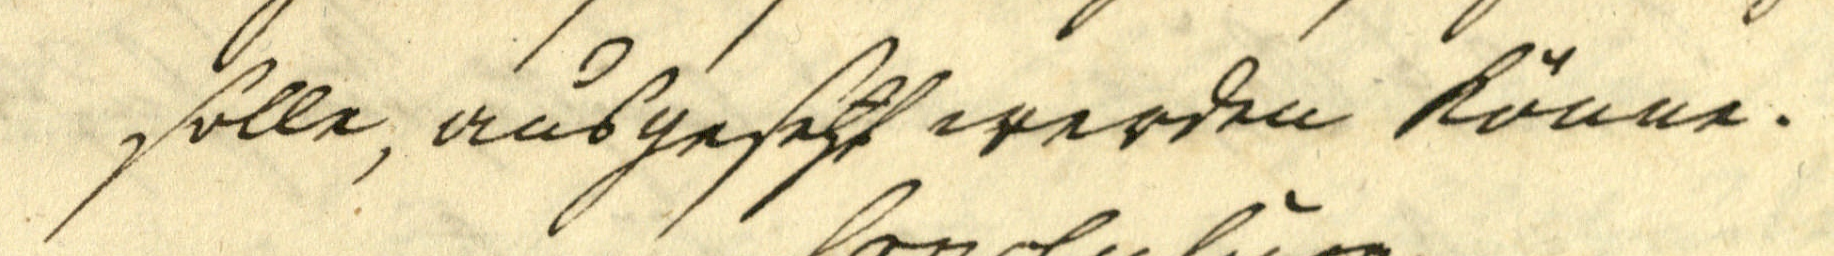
solle, ausgesetzt werden könne.
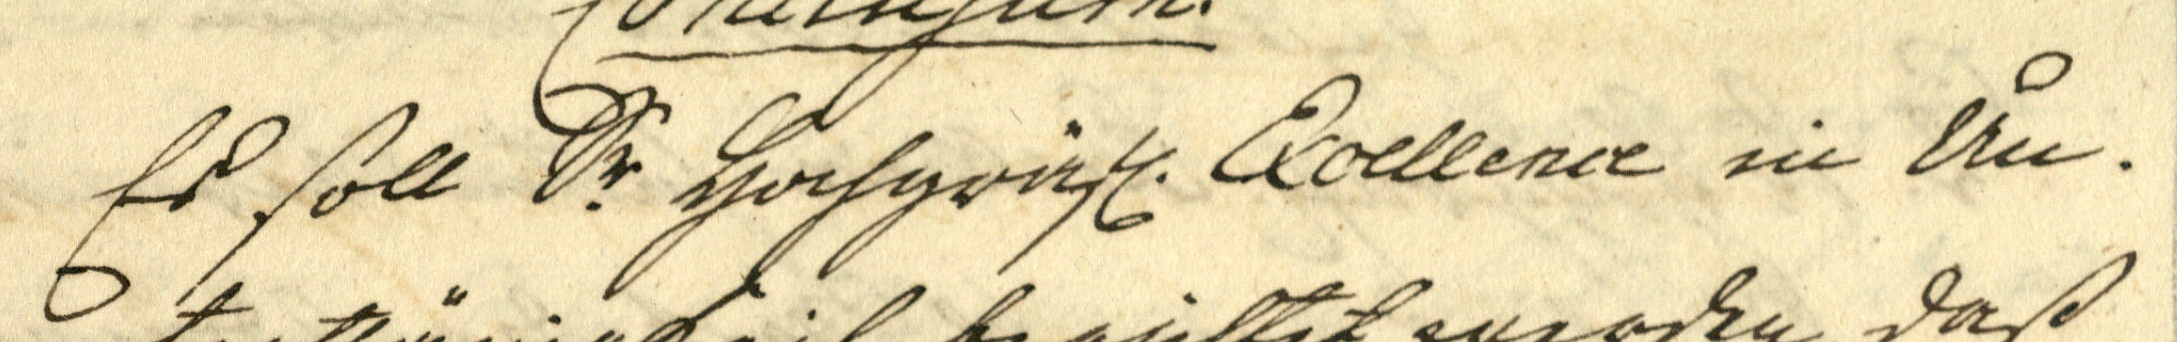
Es soll Sr Hochgräfl Excellence in Un¬
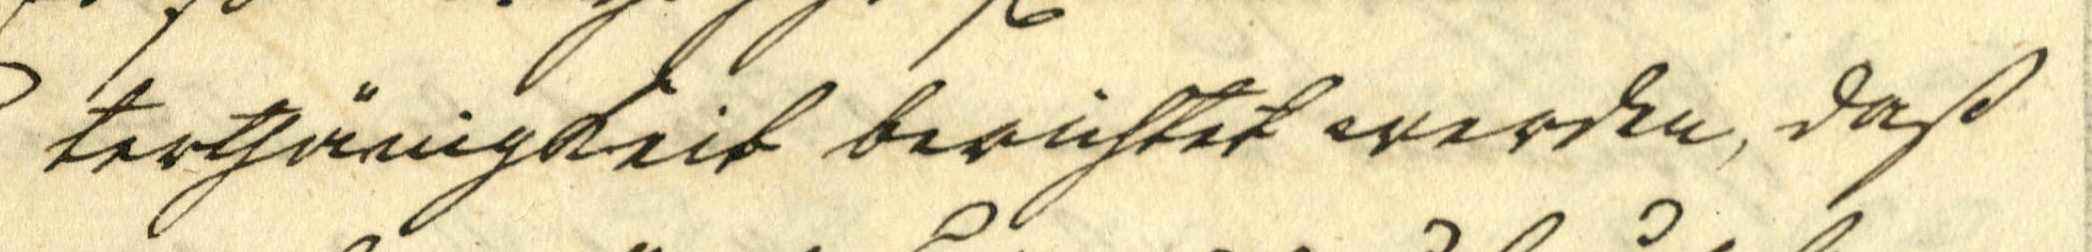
terthänigkeit berichtet werden, daß
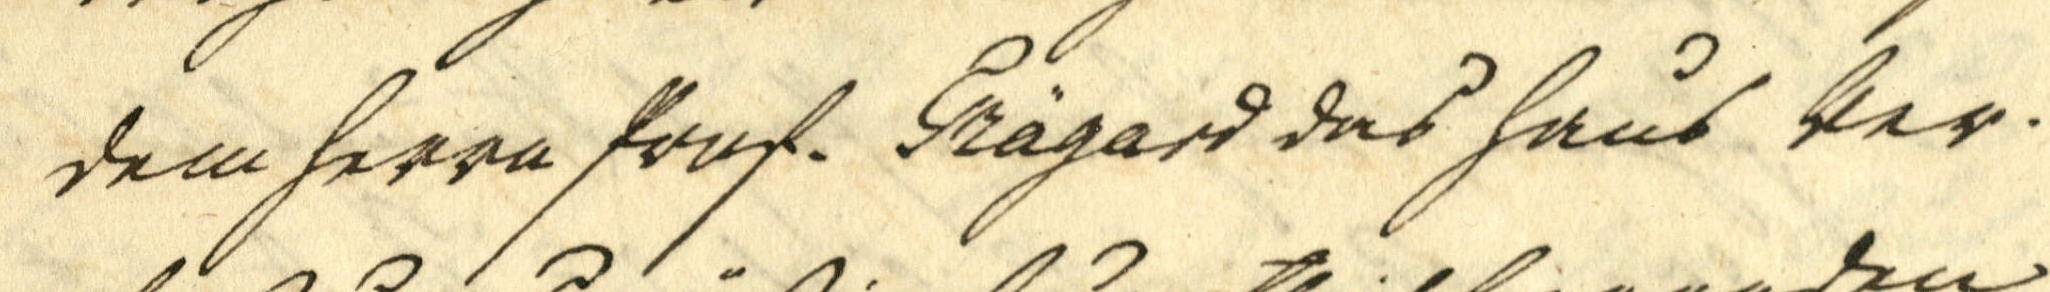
dem Herrn Prof. Trägård das Haus Ver¬
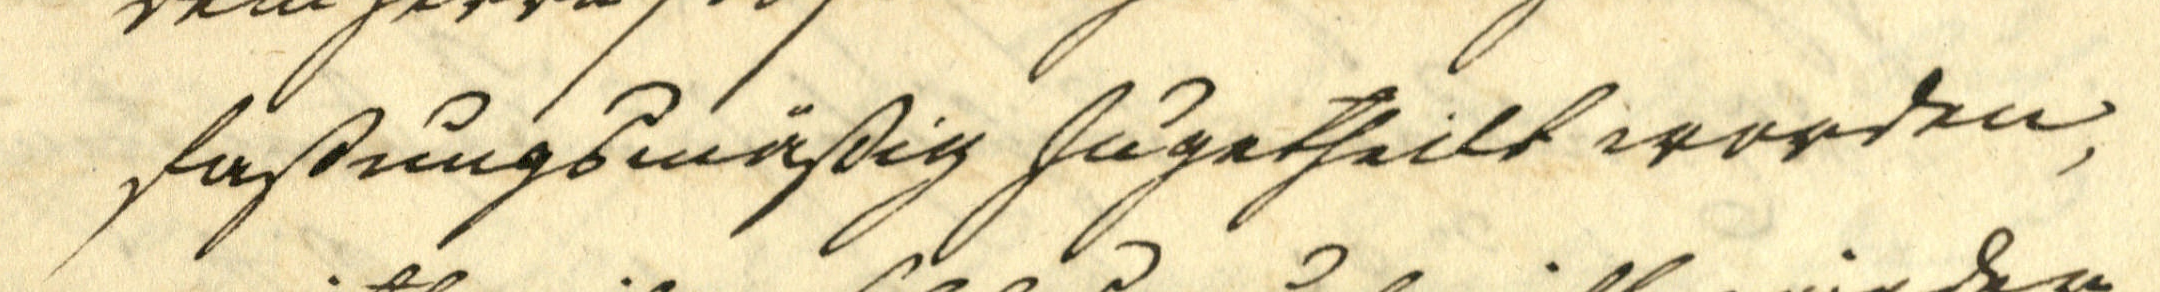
faßungsmäßig zugetheilt worden,
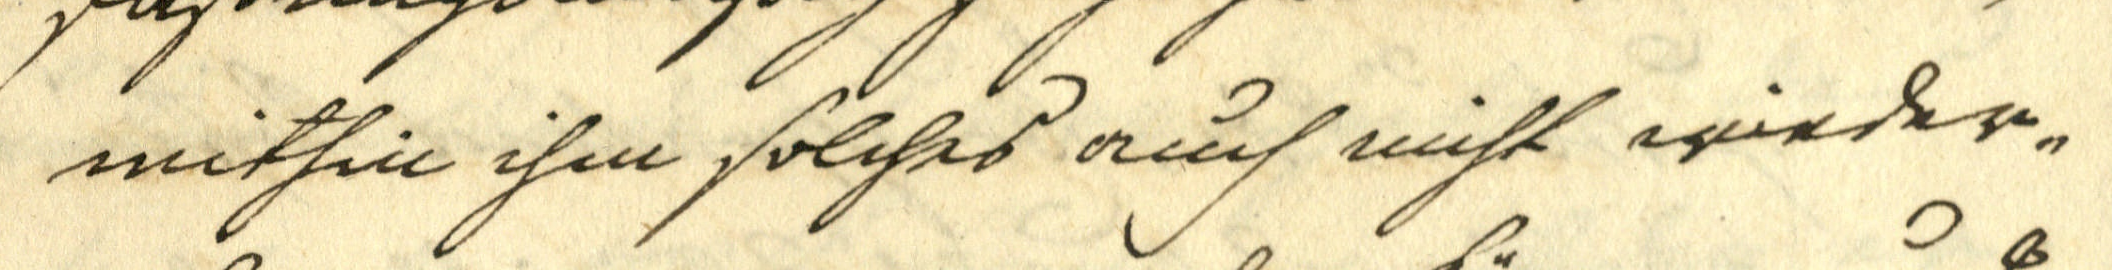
mithin ihm solches auch nicht wieder¬
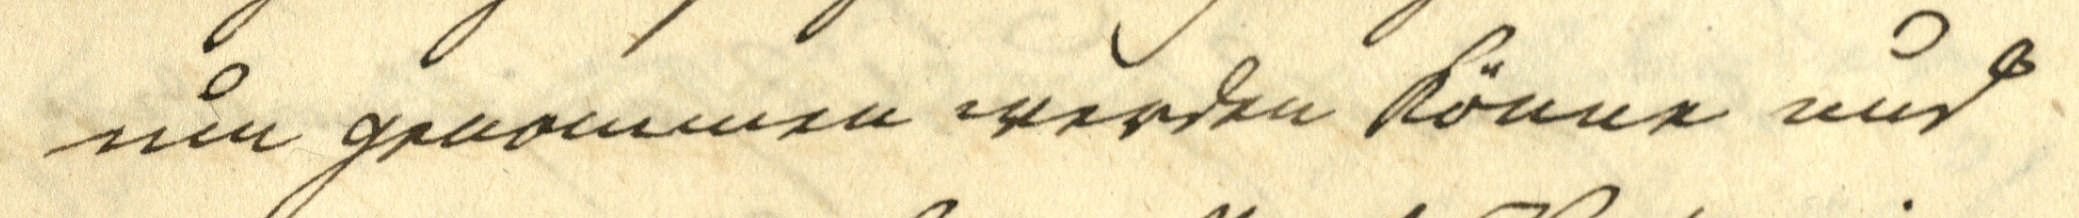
um genommen werden könne und
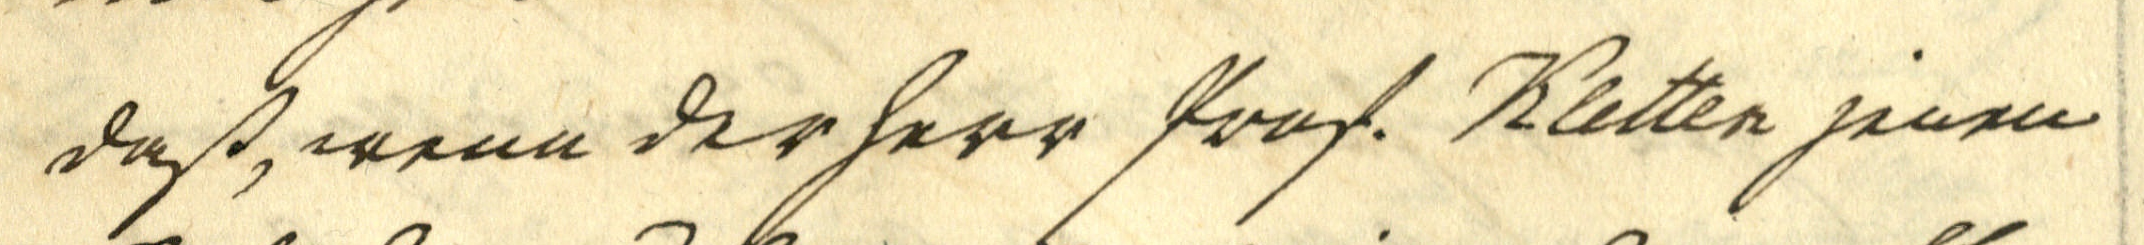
daß, wenn der Herr Prof. Kletten jenen
